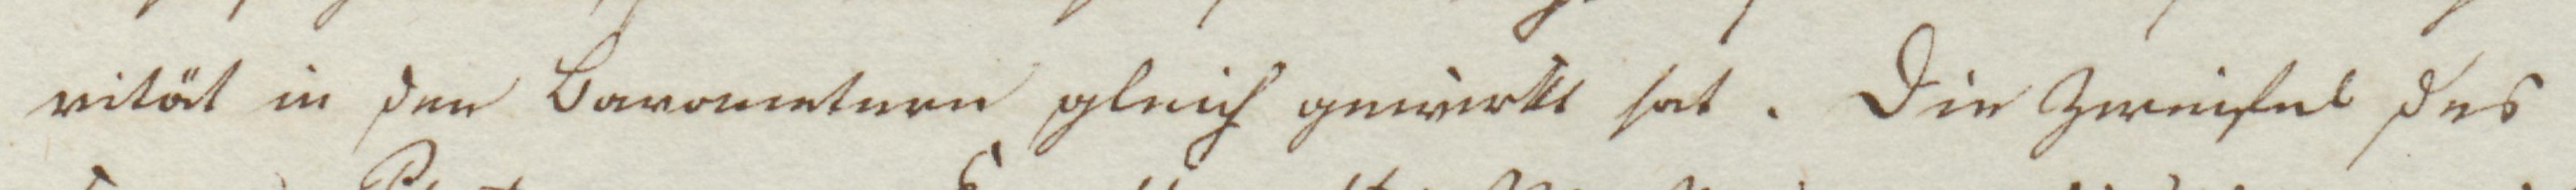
rität in den Barometern gleich gewirkt hat. Die Zweifel des
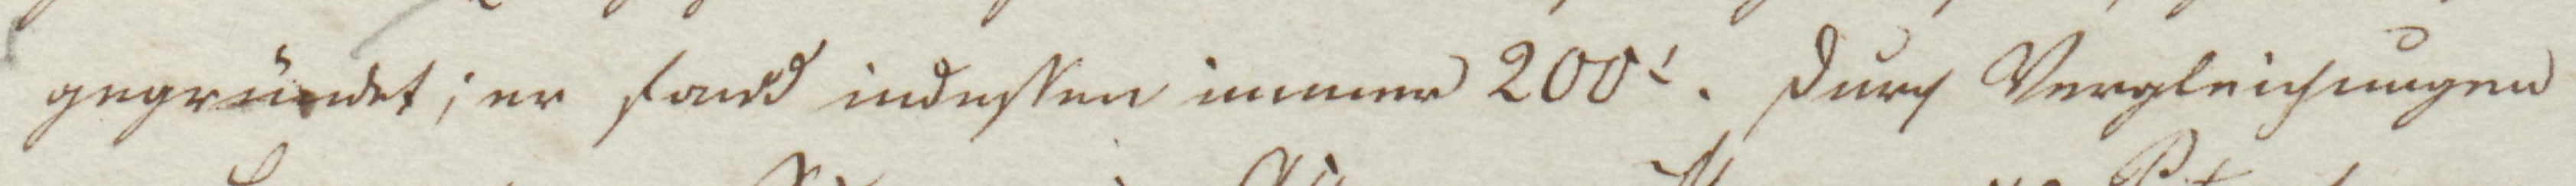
gegründet; er indessen immer 200′. Durch Vergleichungen
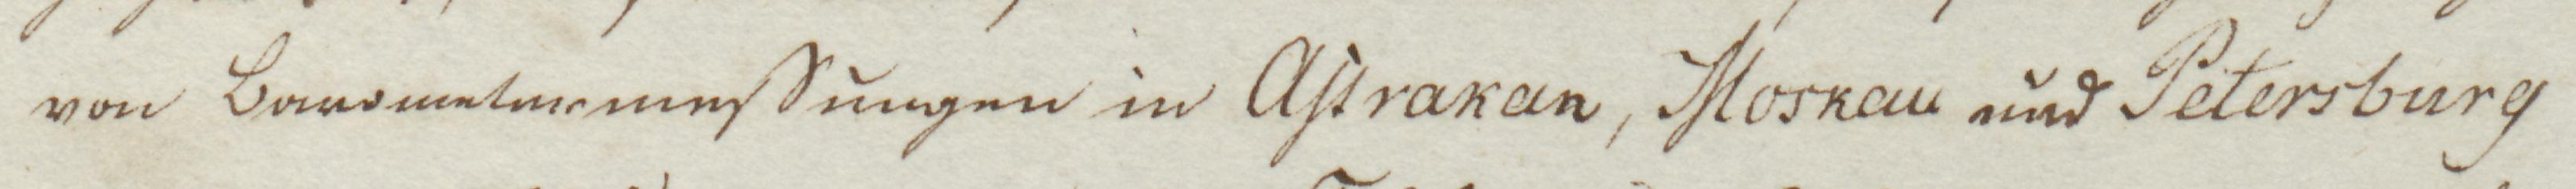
von Barometermessungen in Astrakan, Moskau u.und Petersburg
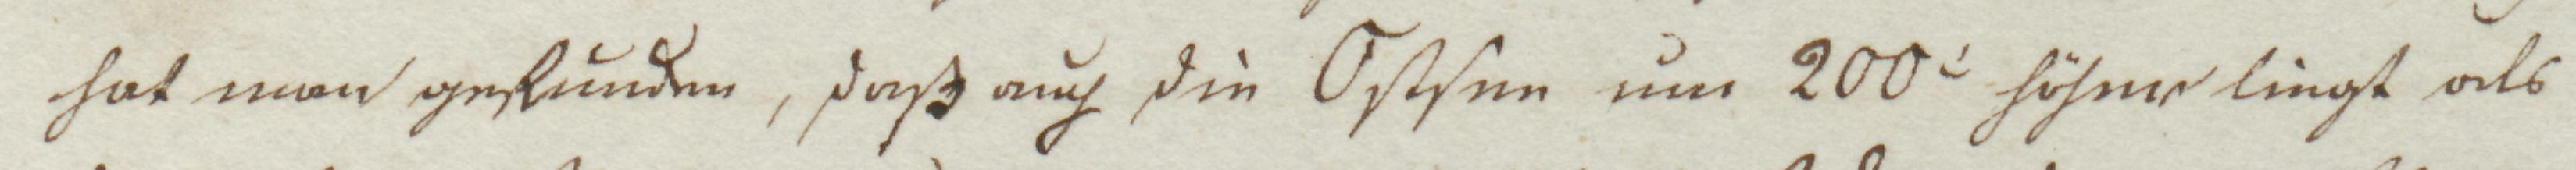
hat man gefunden, daß auch die Ostsee um 200′ höher liegt als
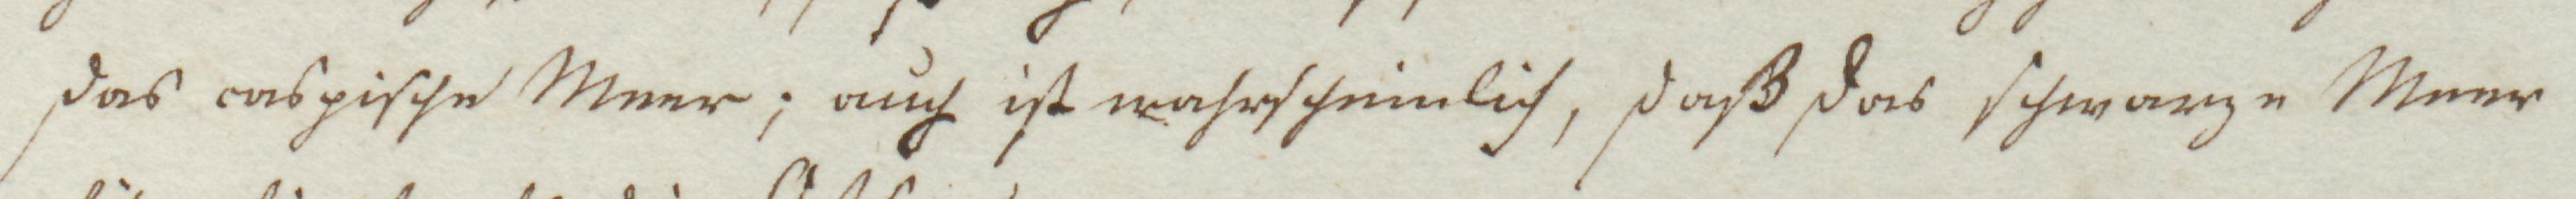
das caspische Meer; auch ist wahrscheinlich, daß das schwarze Meer
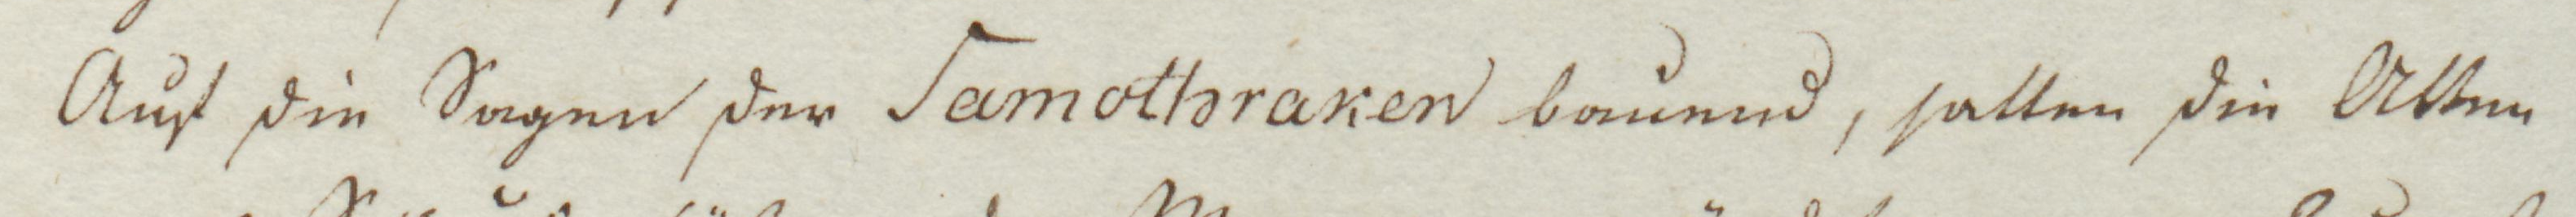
Auf die Sagen der Samothraken bauend, hatten die Alten
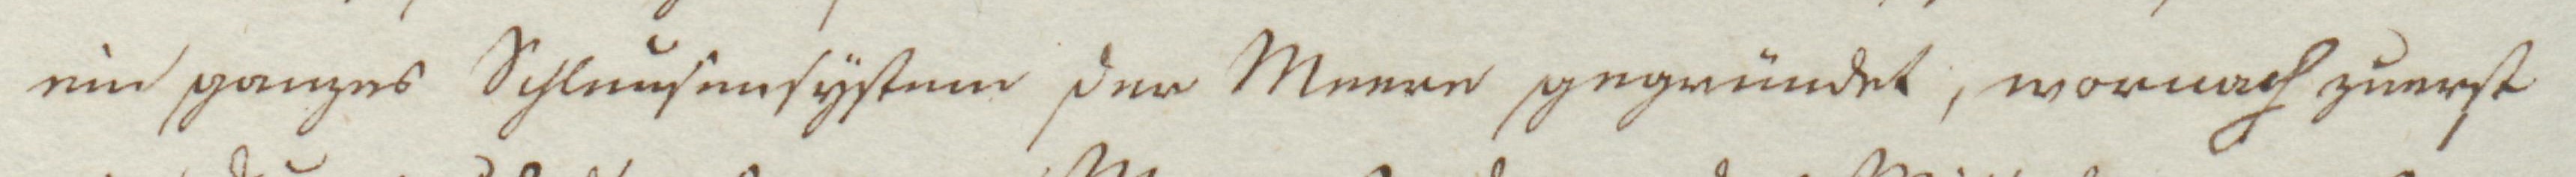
ein ganzes Schleusensÿstem der Meere gegründet, wornach zuerst
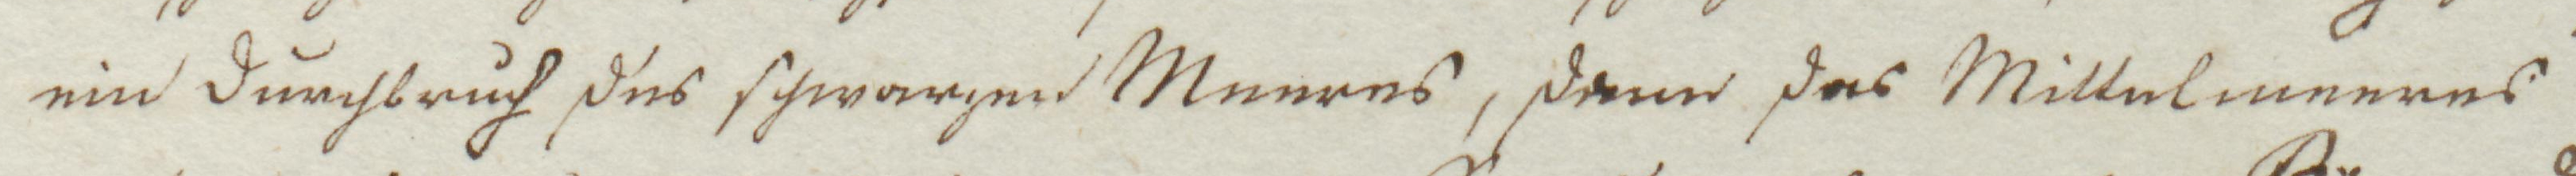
ein Durchbruch des schwarzen Meeres, deann des Mittelmeeres
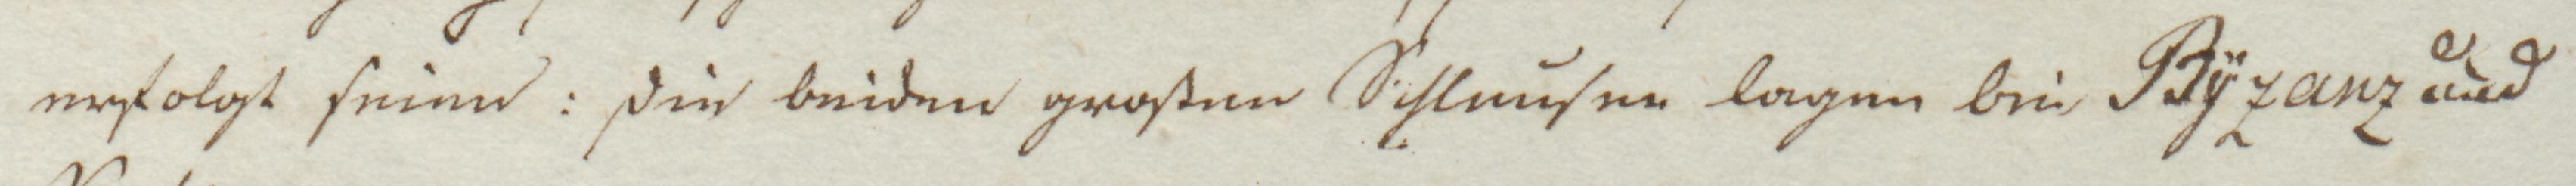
erfolgt seien: die beiden großen Schleusen lagen bei Bÿzanz u.und
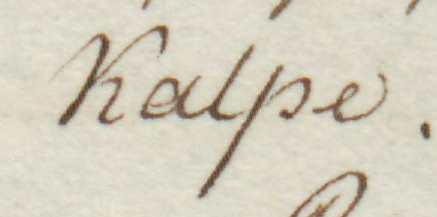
Kalpe.
